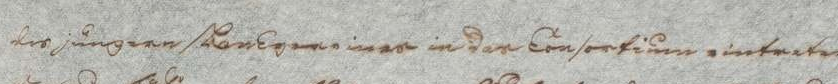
des jüngern Bankvereines in das Consortium eintreten
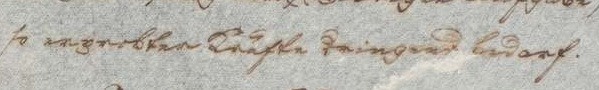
so erprobter Kräfte dringend bedarf.
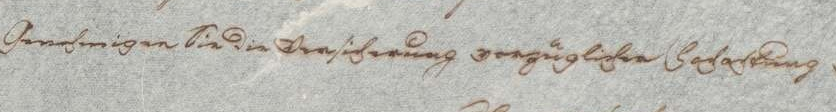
Genehmigen Sie die Versicherung vorzüglicher Hochachtung
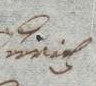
Zürich
